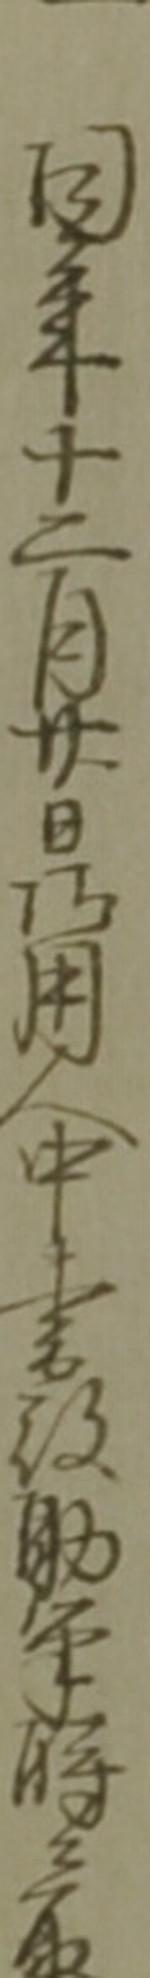一同年十二月廿日御用人中書役助筆時ニ取
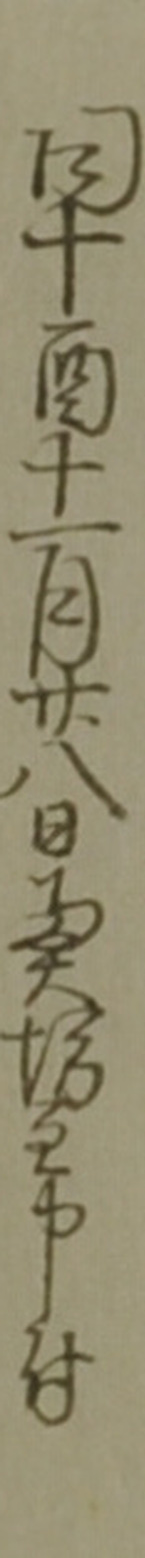一同十酉十一月八日奥坊主申付

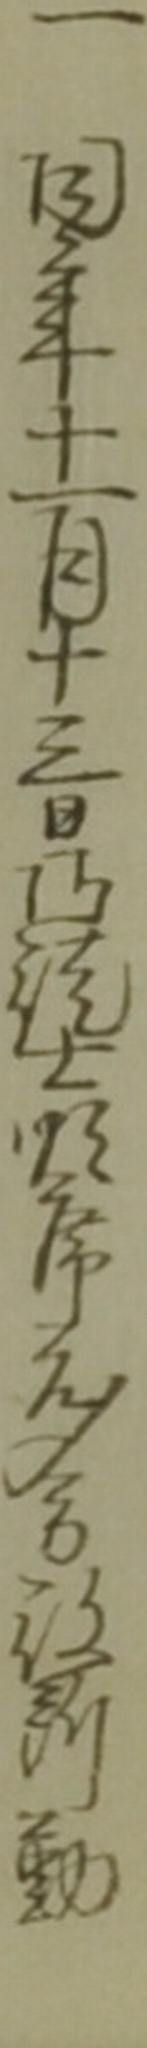一同年十一月十三日御徒士順席元〆方役所勤
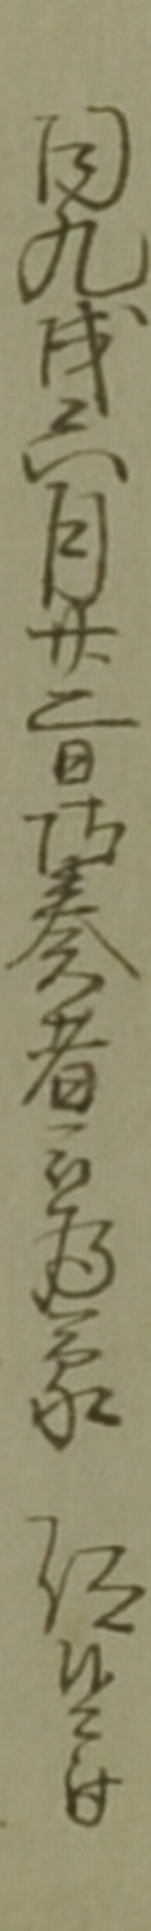一同九戌六月廿二日御奏者被為我仰付ニ付
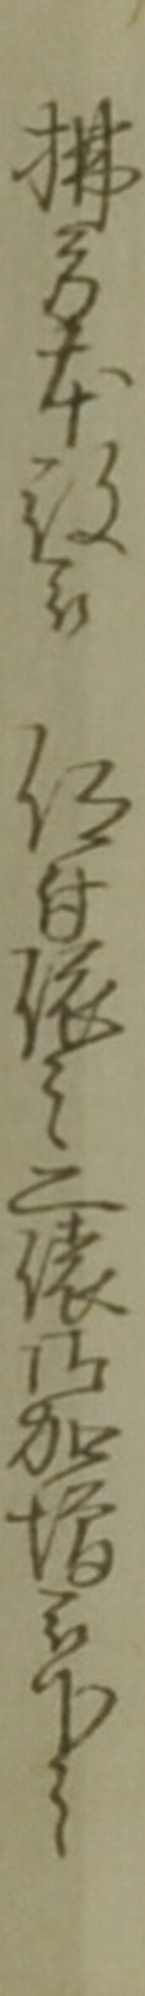払方本役被仰付依之二俵御加増被下之
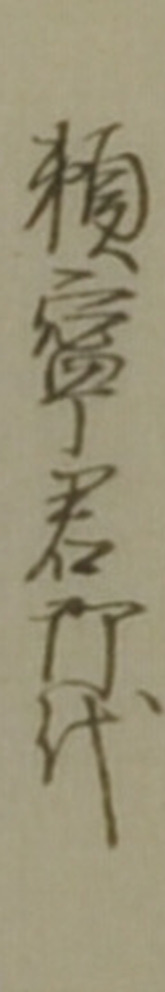頼寧君御代
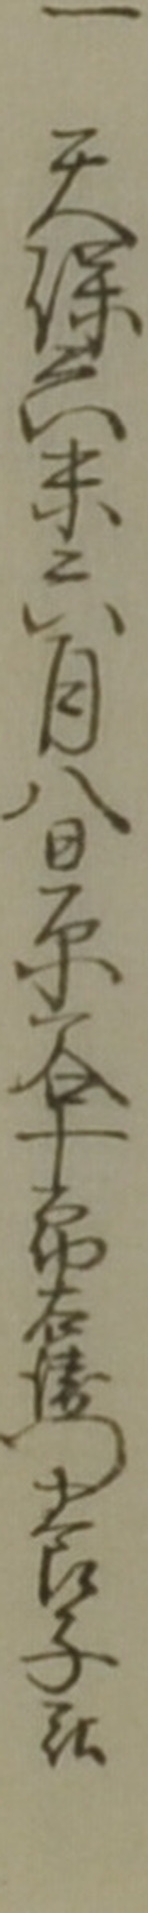一天保六未六月八日原谷十郎右衛門養子被
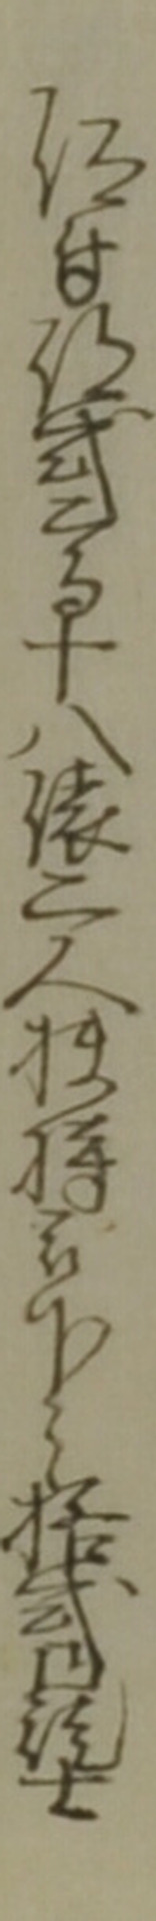仰付跡式高十八俵二人扶持被下之格式御徒士
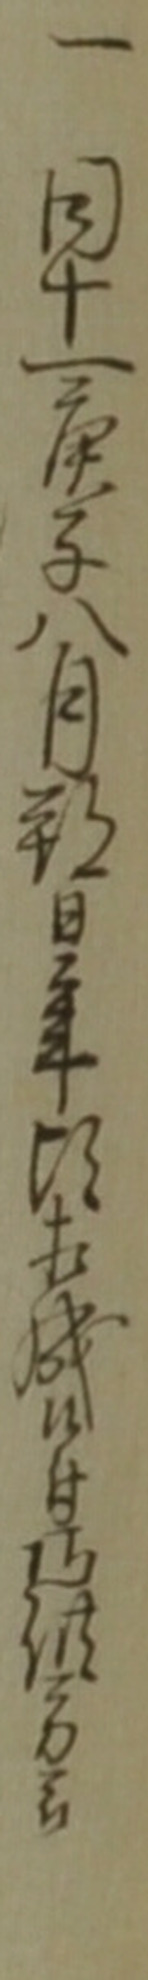一同十一庚子八月朔日年頃相成候付御供方被
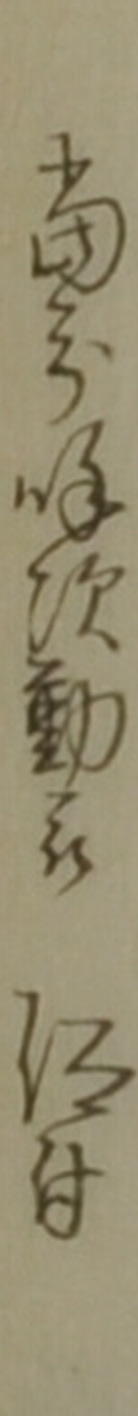当分呼次勤被仰付
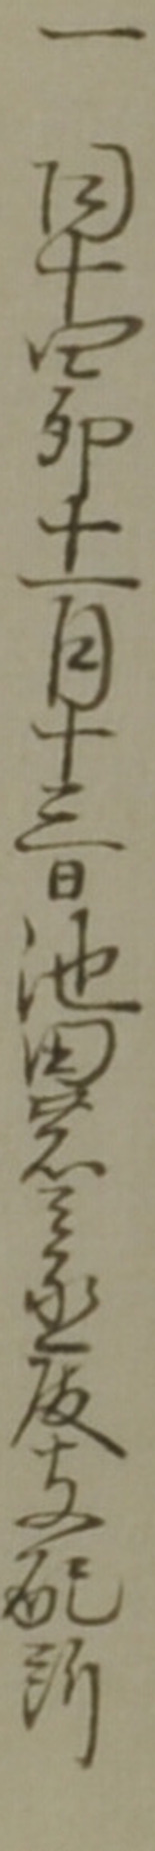一同十四卯十一月十三日池田◻︎之丞殿支配所
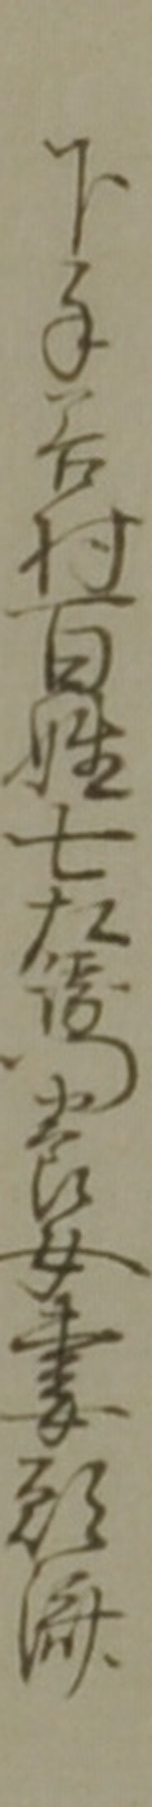下手谷村百姓七左衛門養女妻願済
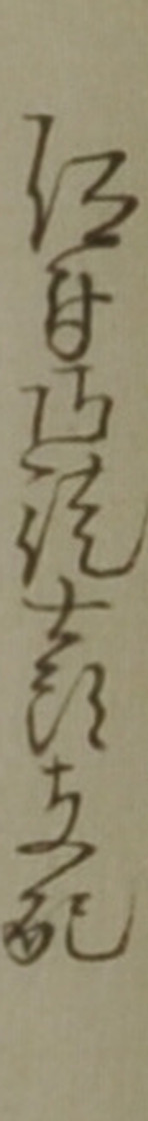仰付御徒士頭支配
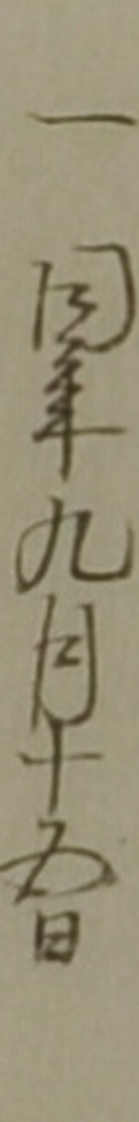一同年九月十五日
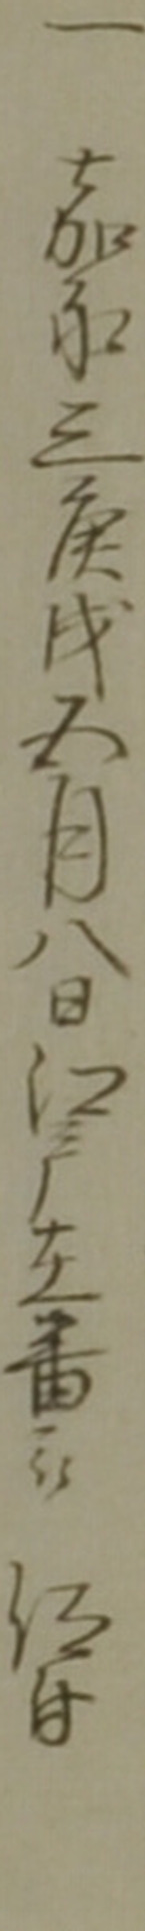一嘉永三庚戌五月八日江戸在番被仰付
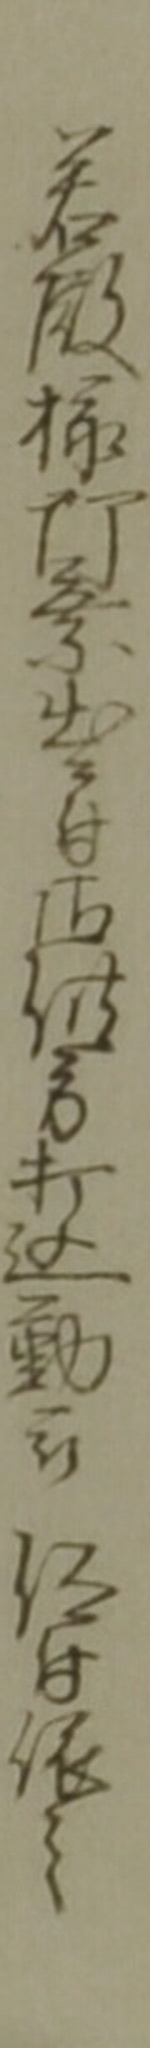若殿様御乗出ニ付御供方打込勤被仰付依之
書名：無足諸士勤仕録（六）
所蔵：伊那市立高遠町図書館・合同会社AMANE
